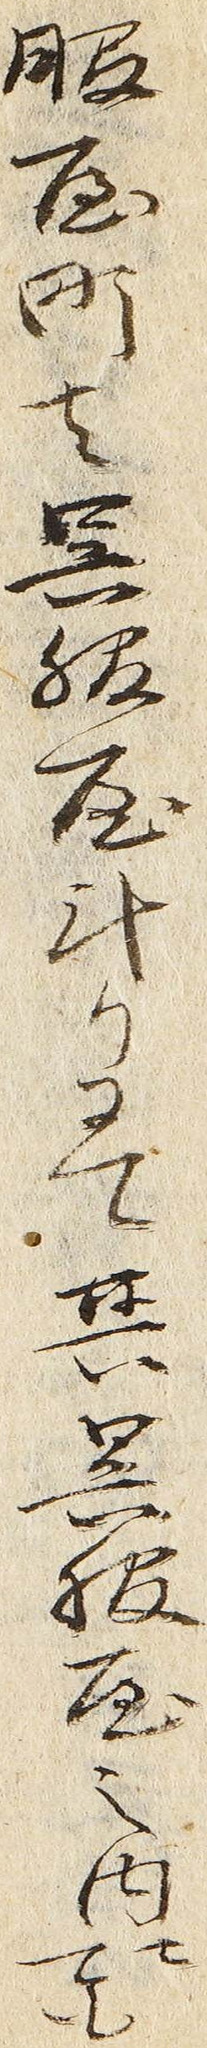服屋町は呉服屋斗りにて其呉服屋之内にても
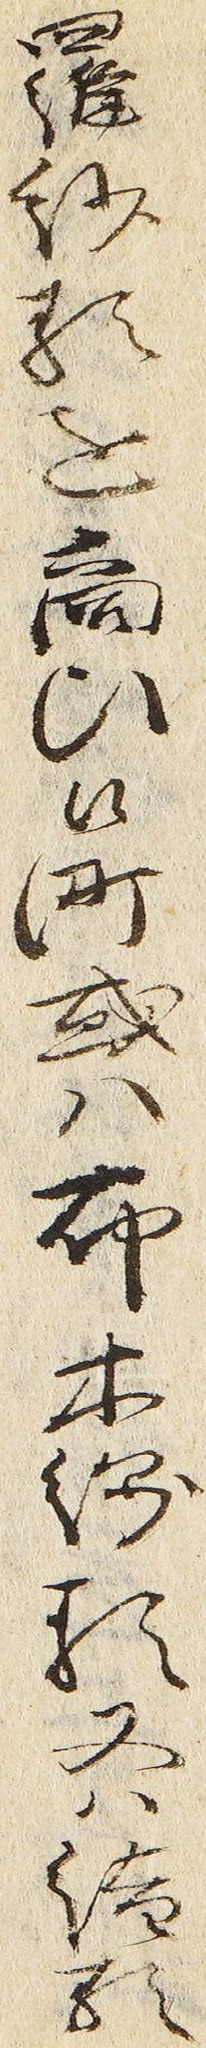羅紗類を商ひ候町或は布木綿類又は絹類
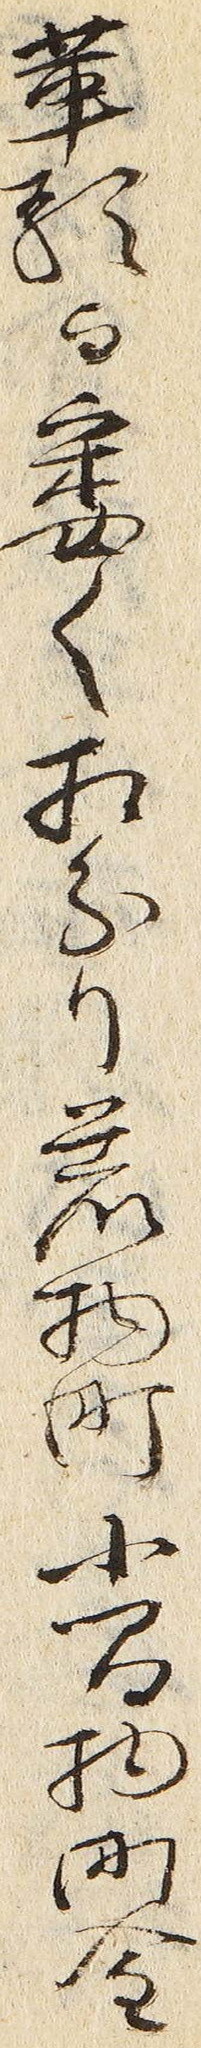革類と悉く相分り荒物町小間物町金
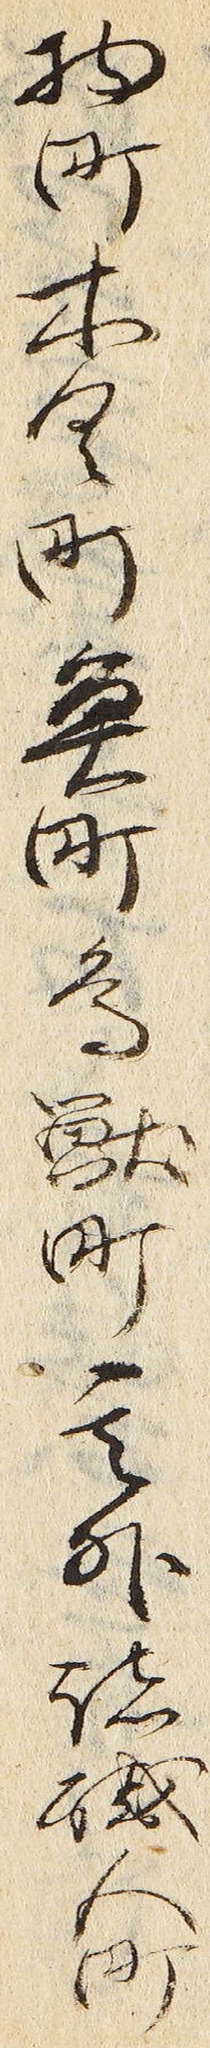物町木具町魚町鳥獣町其外諸職人町
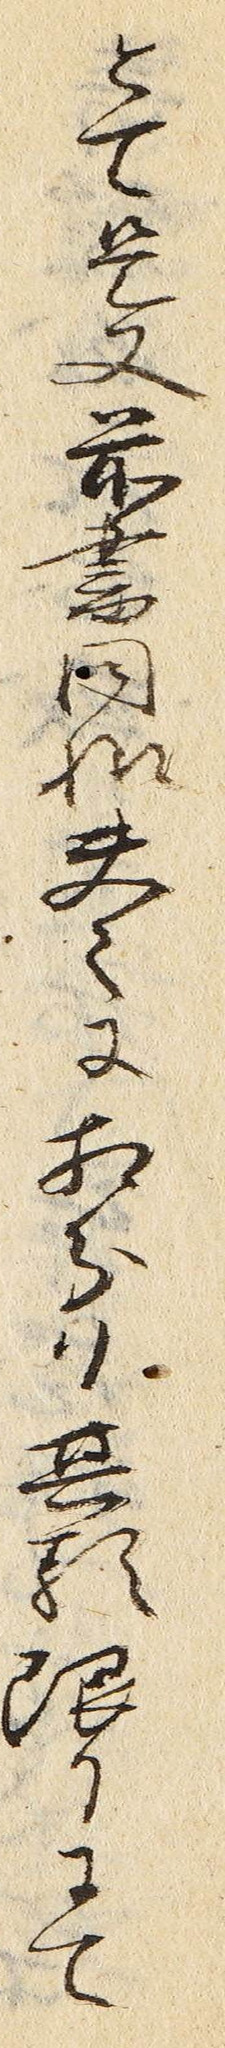とて是又前書同様夫々に相分り其類限りにて
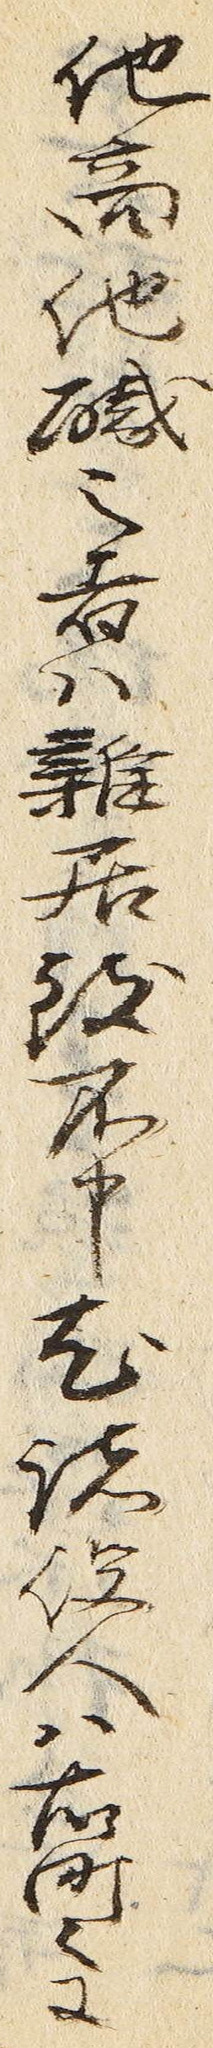他商他職之者は雑居致不申尤諸役人は右町々に
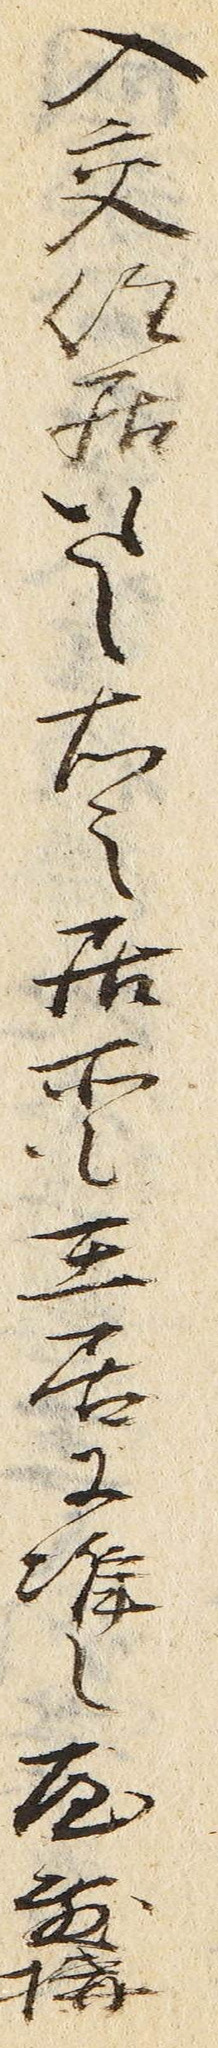入交住居いたし右之居所も王居に准し屋敷構
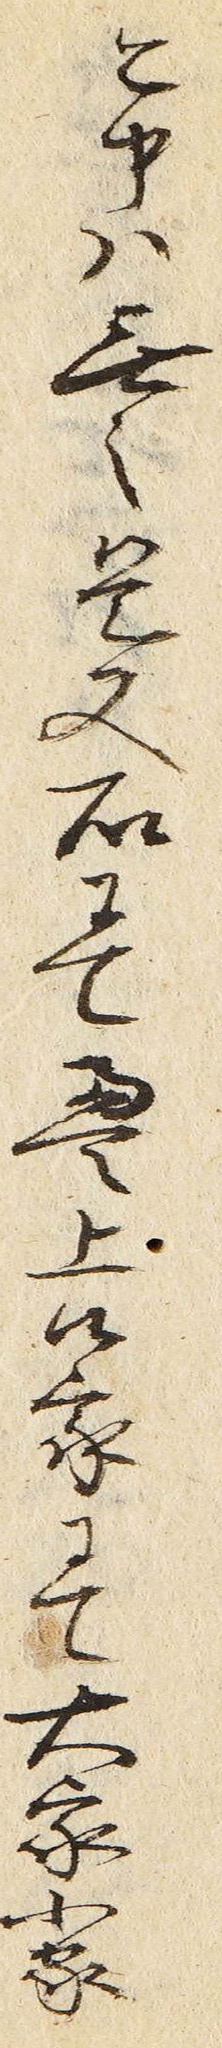と申は無之是又石にて畳上候家にて大家小家
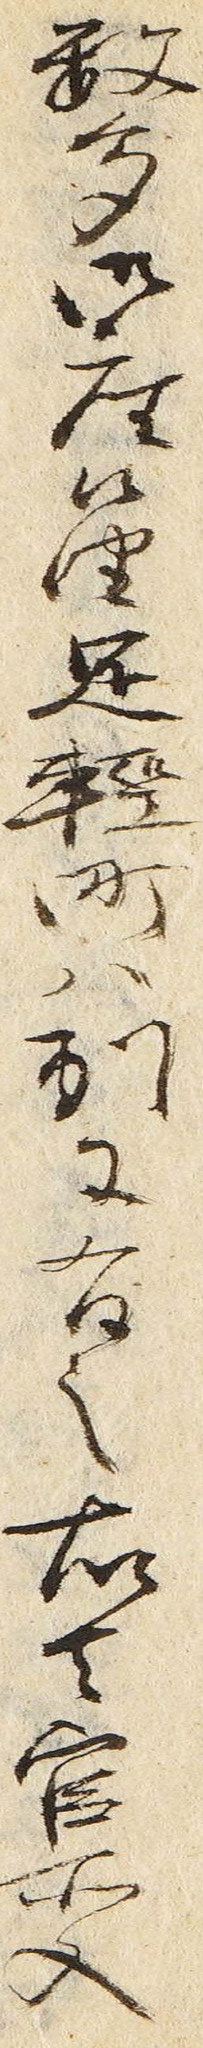数多御座候由足軽町は別に有之右は官所入
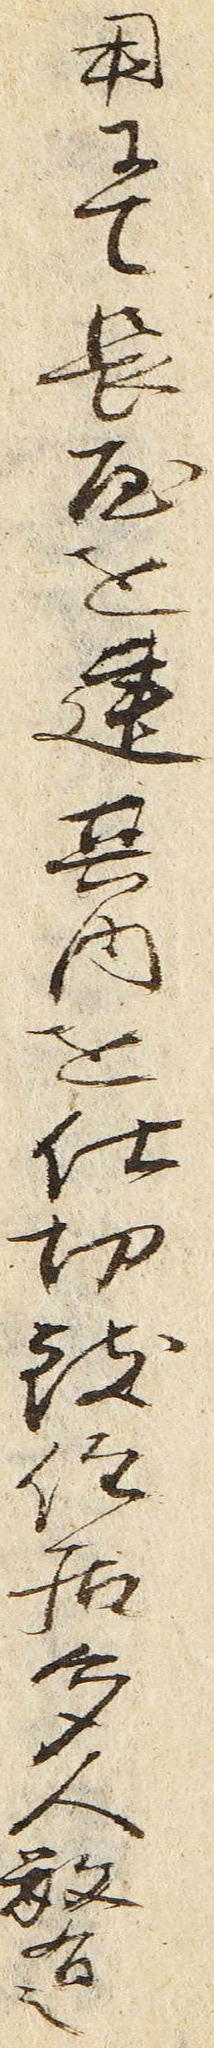用にて長屋を建其内を仕切致住居多人数有之
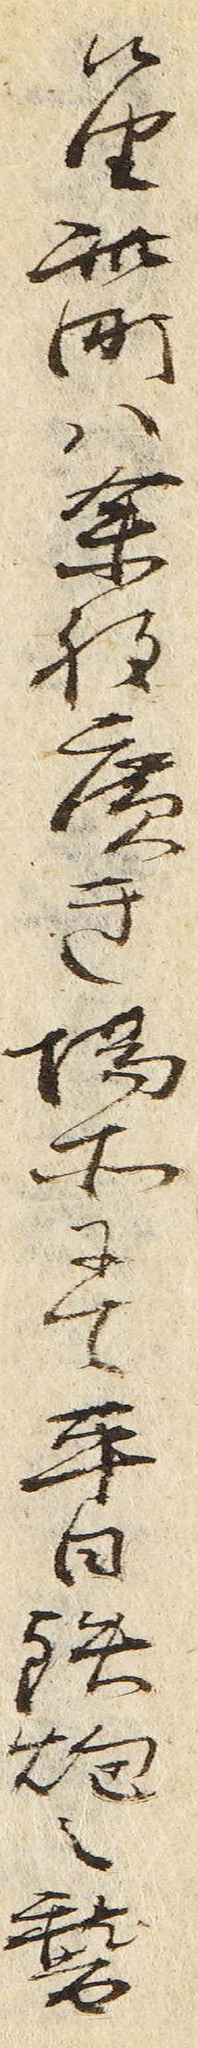候由此町は余程広き場所にて平日鉄炮之稽
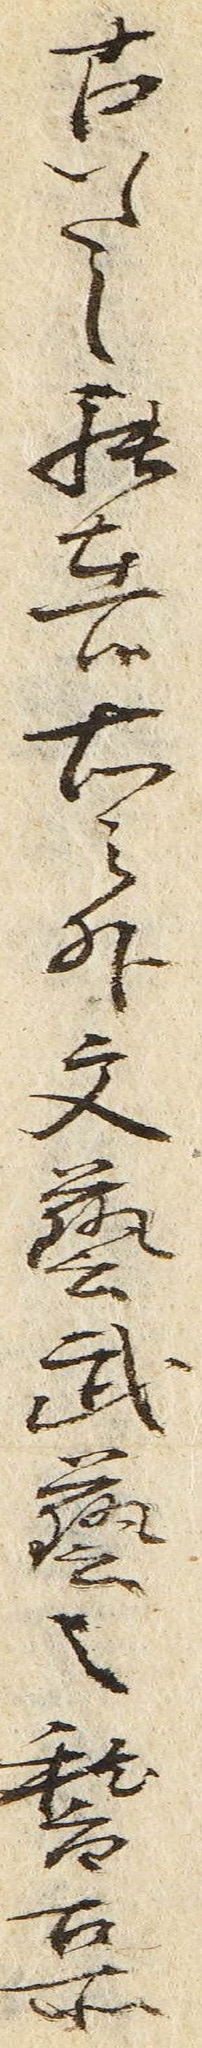古いたし罷在候右之外文芸武芸之稽古所
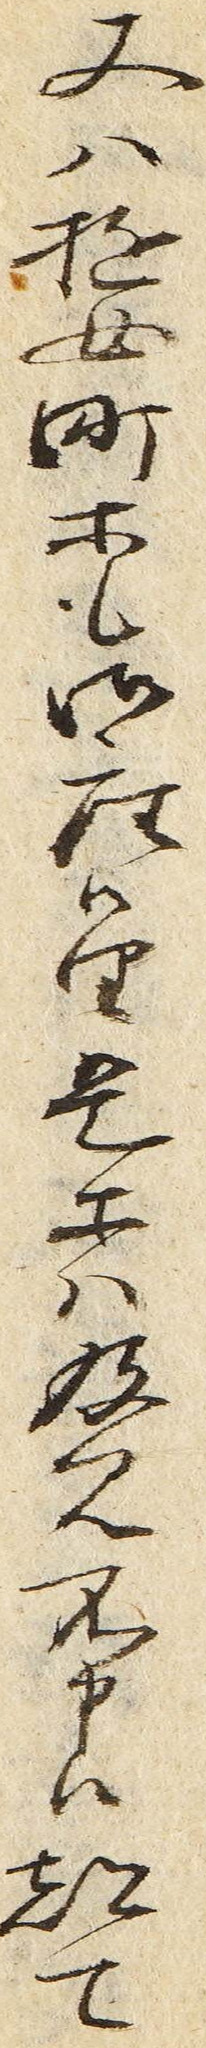又は遊女町等も御座候由是等は及見不申候都て
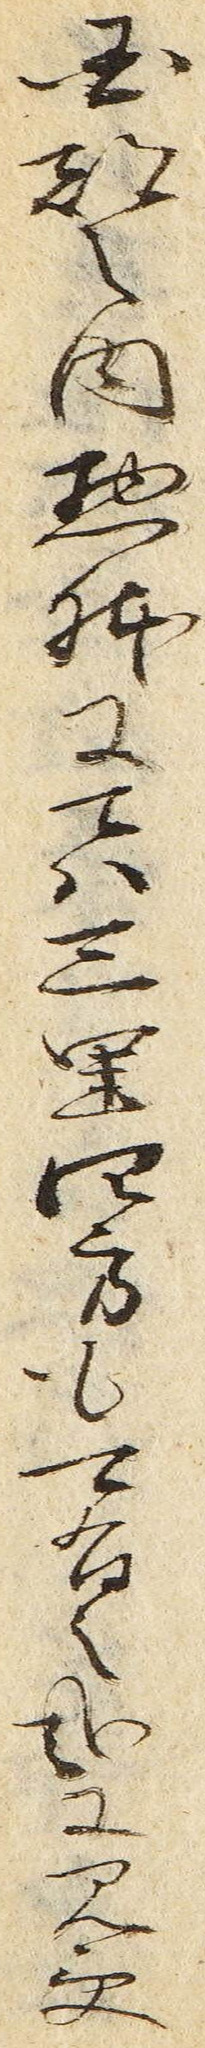国都之内惣体にては三里四方も可有之哉に見受

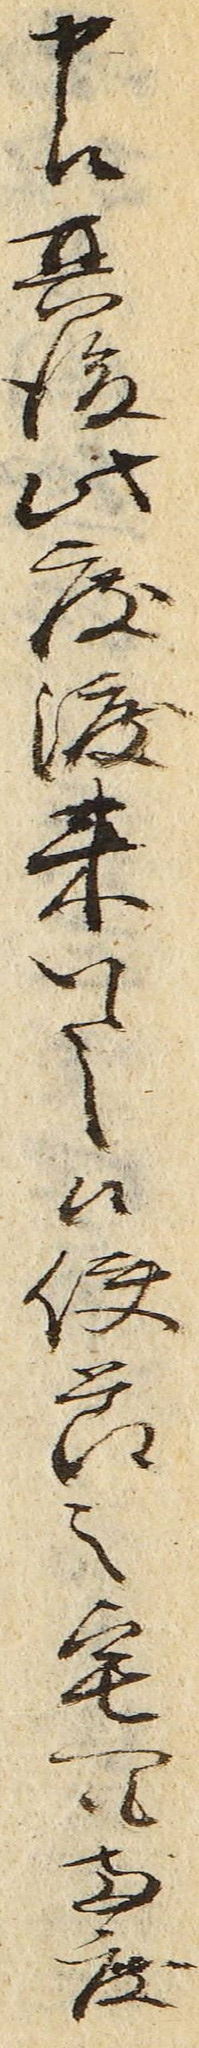申候其後此度渡来いたし候使節之宅へも両度
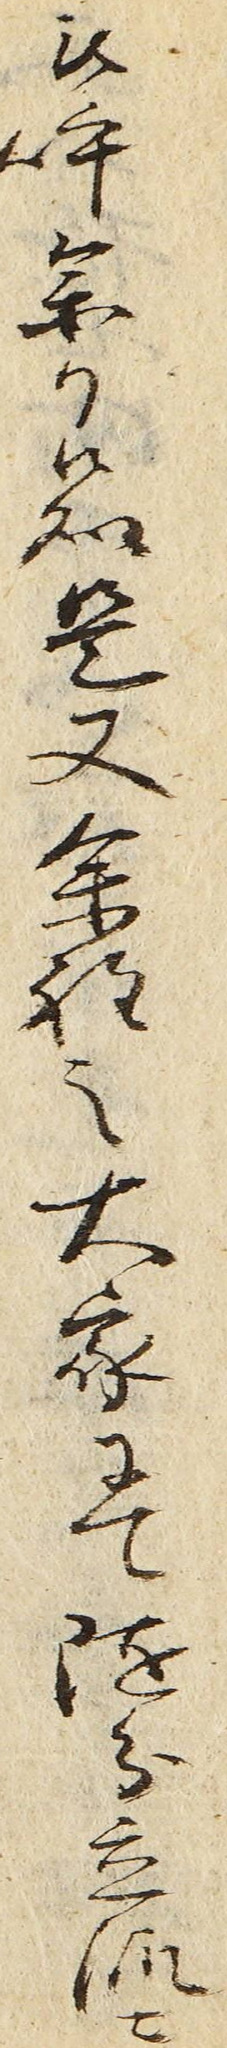被呼参り候処是又余程之大家にて随分立派に
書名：漂民後記
